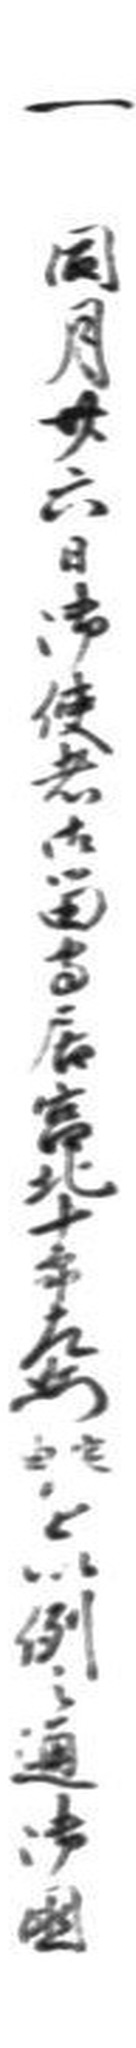一同月廿六日御使者御留守居宮北十郎左衛門定由を以例之通御国
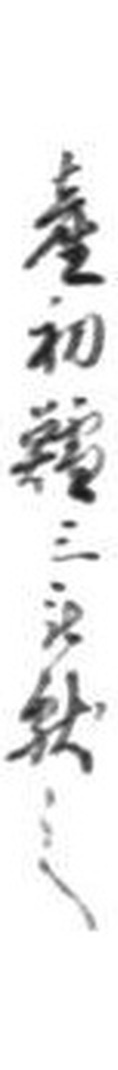産初鱈三被献之
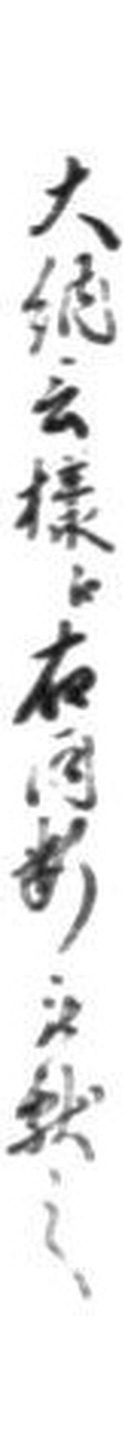大納言様江右同断被献之
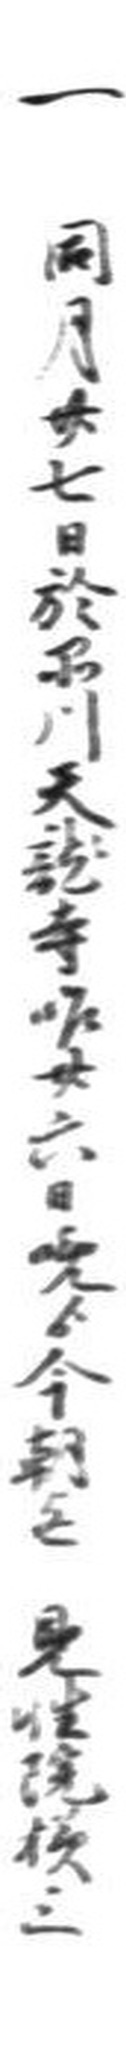一同月廿七日於品川天龍寺昨廿六日晩ゟ今朝迄見性院様三
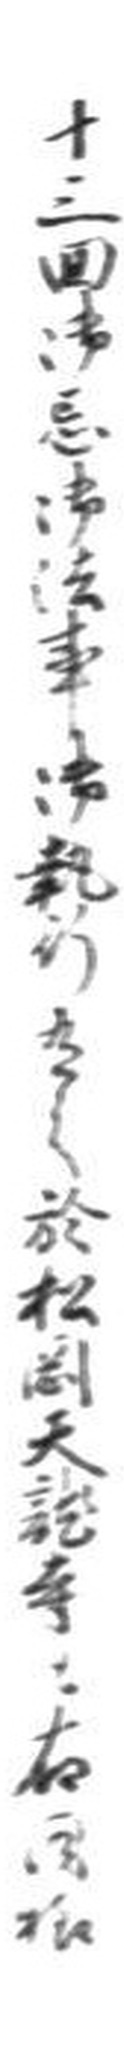十三回御忌御法事御執行有之於松岡天龍寺も右同様
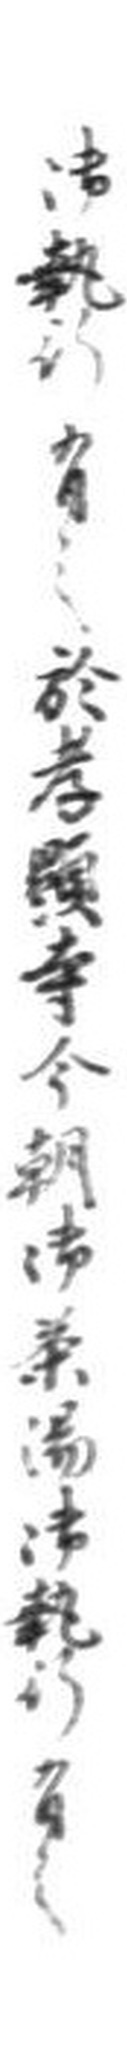御執行有之於孝顕寺今朝御茶湯御執行有之
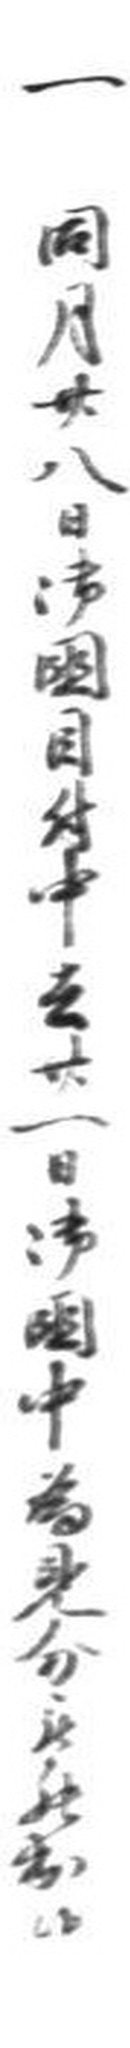一同月廿八日御国目付中去廿一日御国中為見分被罷出候
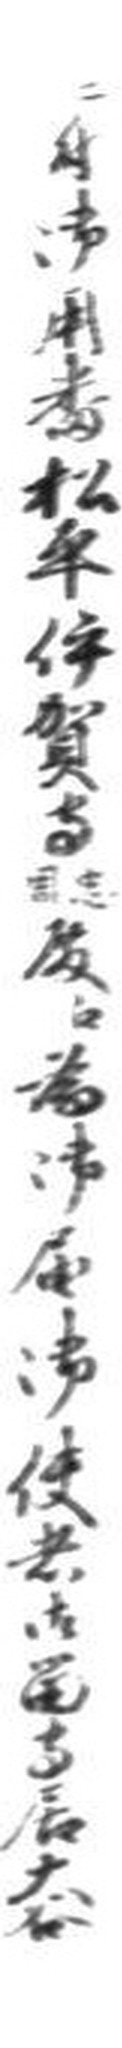ニ付御用番松平伊賀守忠周殿江為御届御使者御留守居大谷

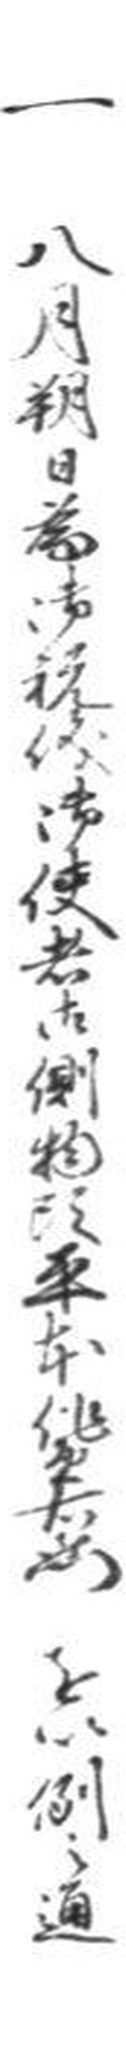一八月朔日為御祝儀御使者御側物頭平本作右衛門を以例之通
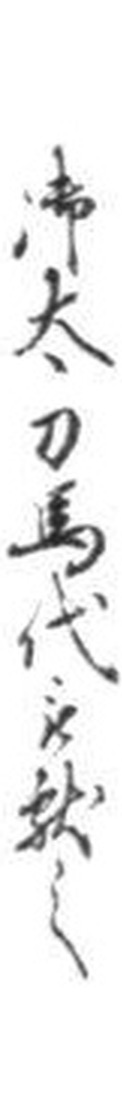御太刀馬代被献之
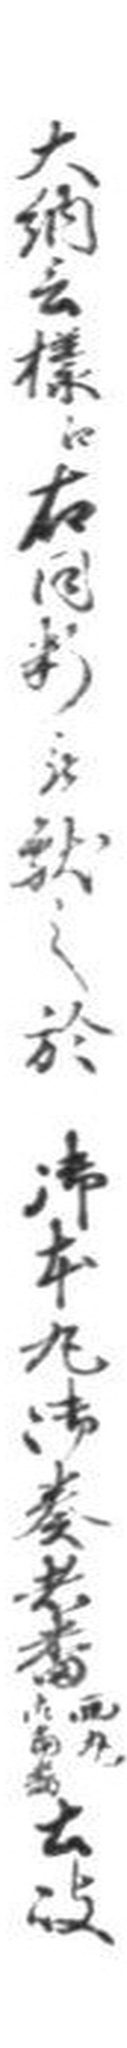大納言様江右同断被献之於御本丸御奏者番西丸御留守土岐
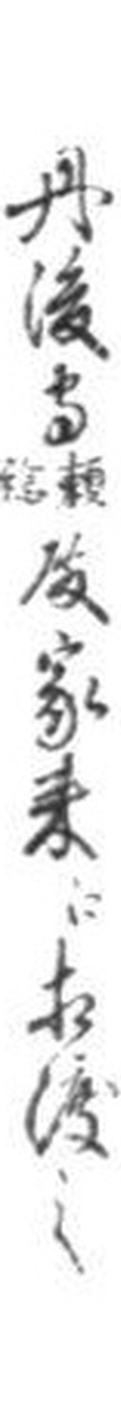丹後守頼稔殿家来江相渡之
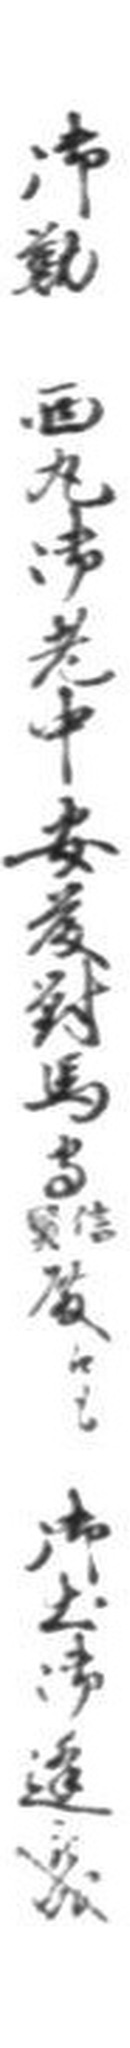御勤西丸御老中安藤対馬守信賢殿江も御出御逢被成
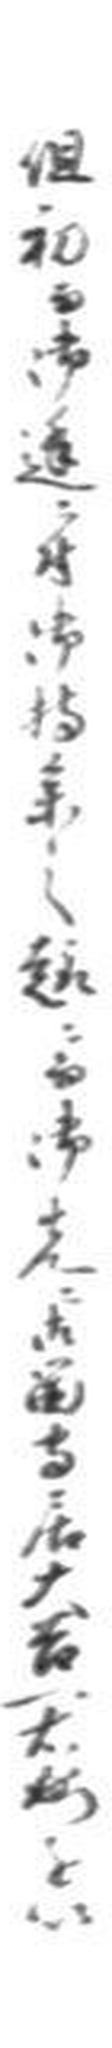但初而御逢ニ付御持参之趣ニ而御先ニ御留守居大谷一右衛門を以
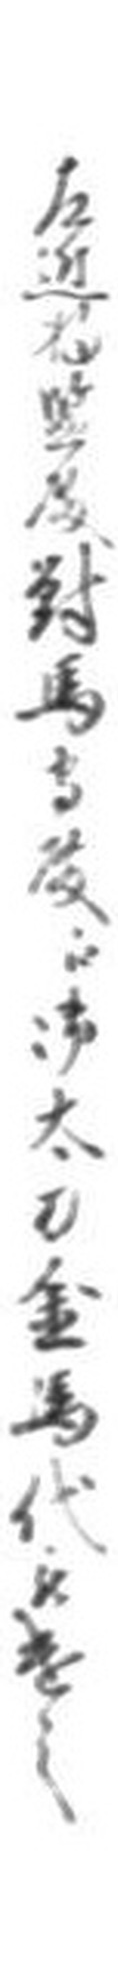左近将監殿対馬守殿江御太刀金馬代被遣之
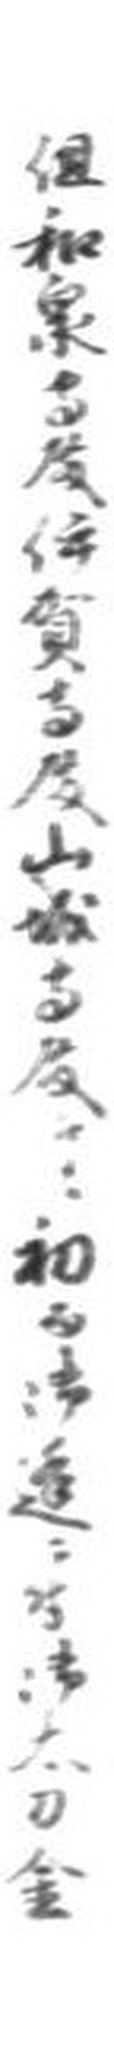但和泉守殿伊賀守殿山城守殿江も初而御逢ニ付御太刀金
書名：家譜 三十九 宗矩公 享保十年
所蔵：福井県文書館 Fukui Prefectural Archives
